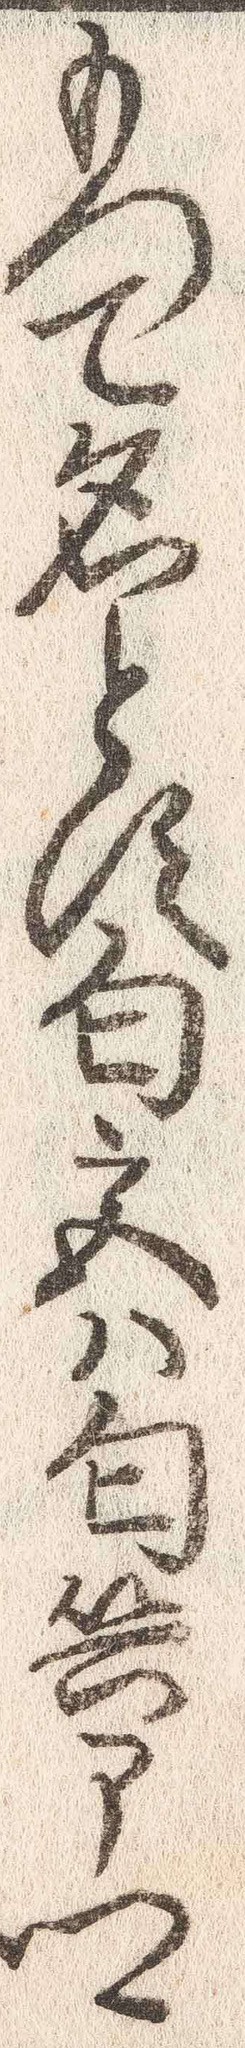もつて名とす匂宮は匂兵部卿
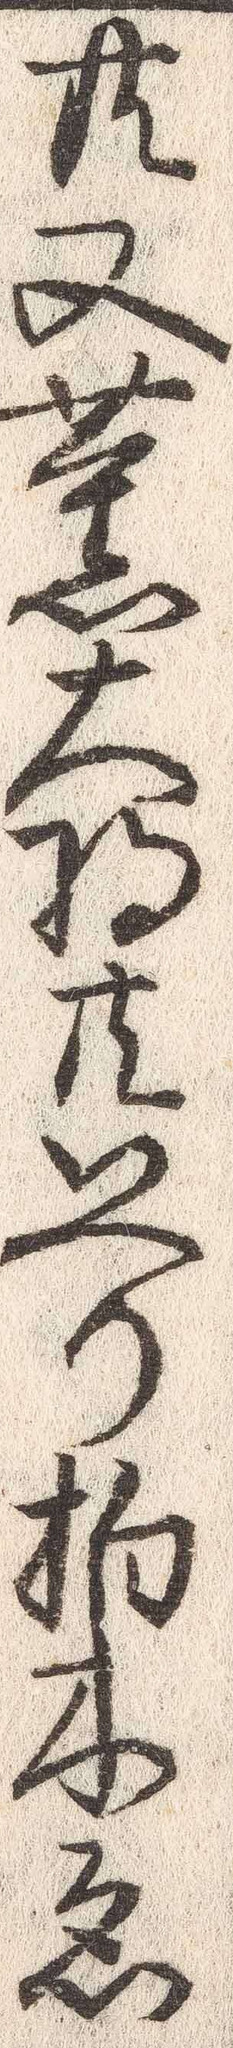共又薫大将共いへり柏木ゑ
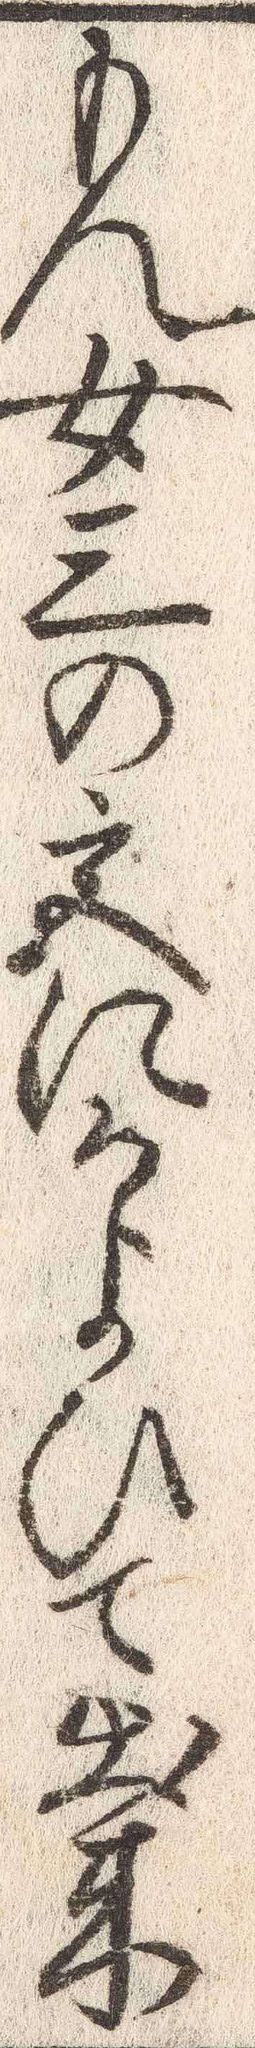もん女三の宮にかよひて出来
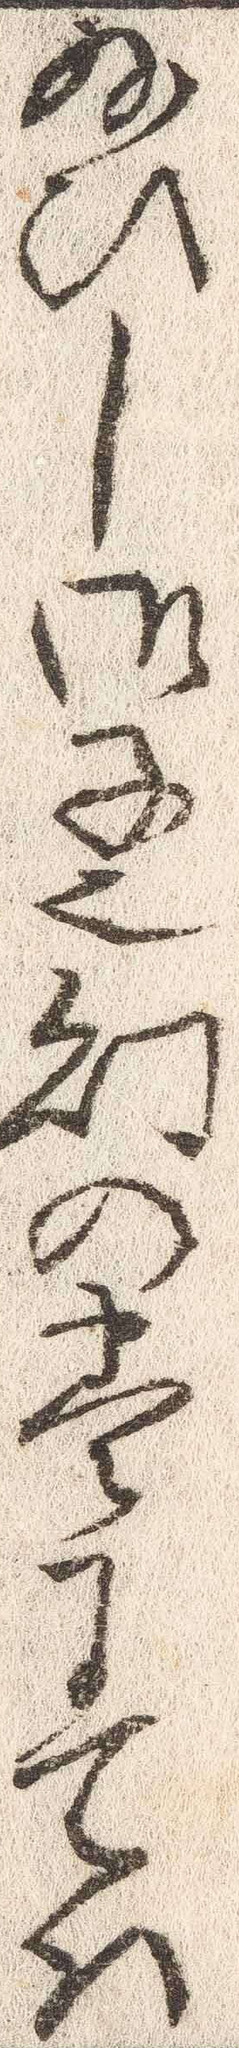給ひし御子也幻の巻にては
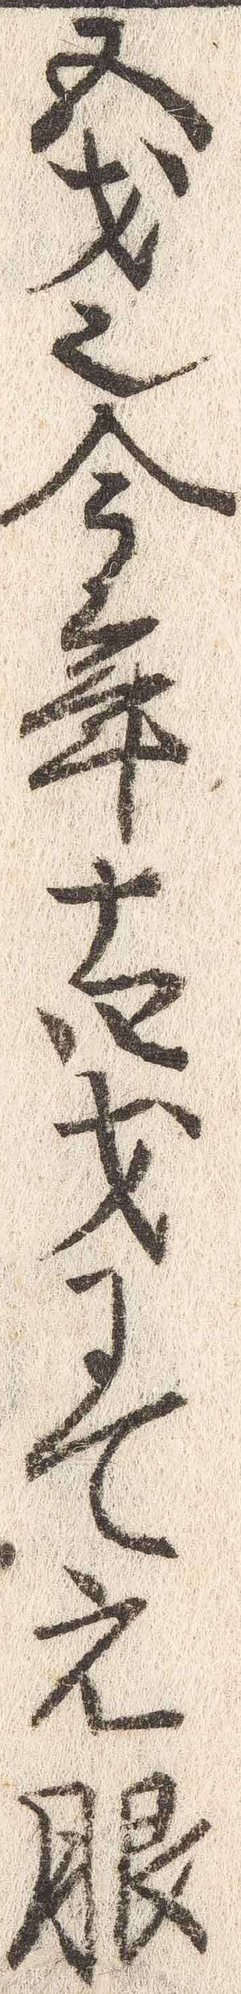五才也今年十四才にて元服
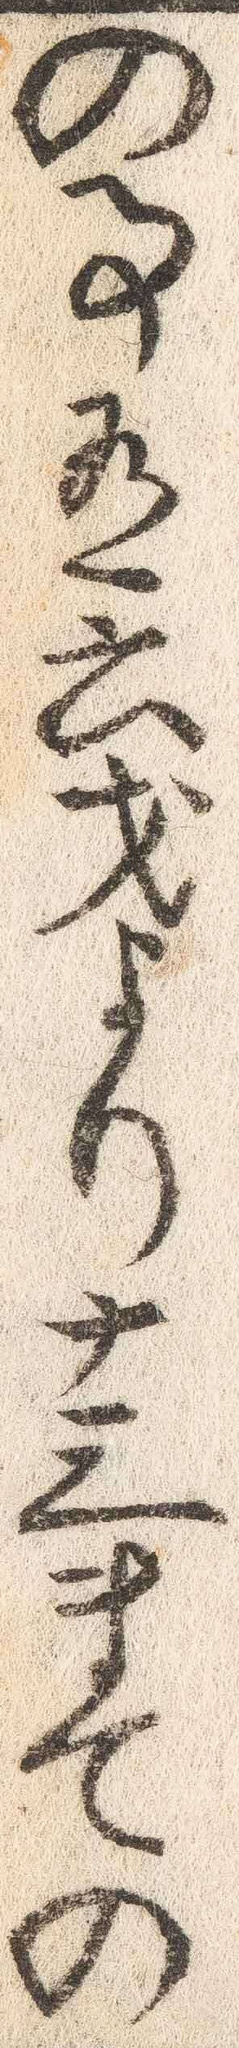の事有六才より十三まての

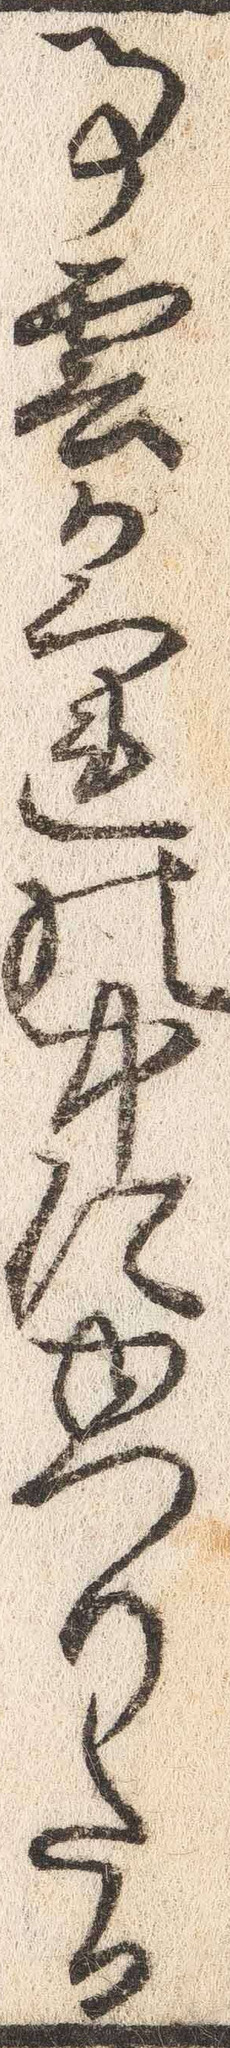事雲かくれの中にゆつりたる
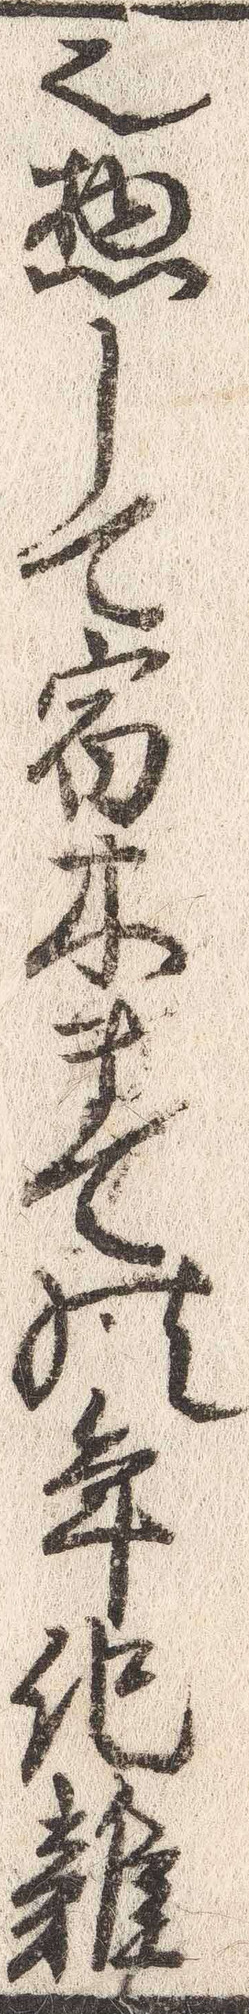也惣して宿木まての年記雑
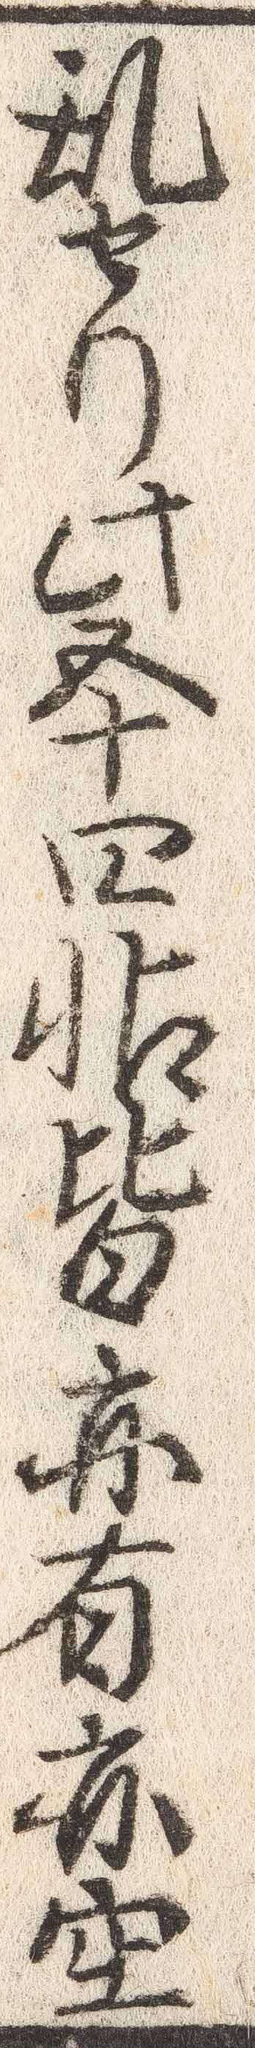乱せり此五十四帖皆亦有亦空
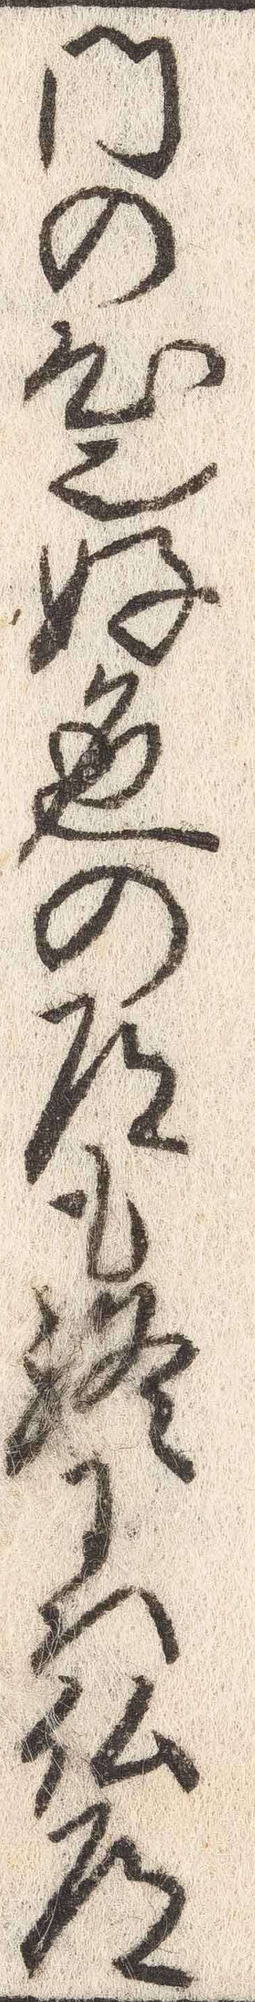門の心也好色の道も終には仏道
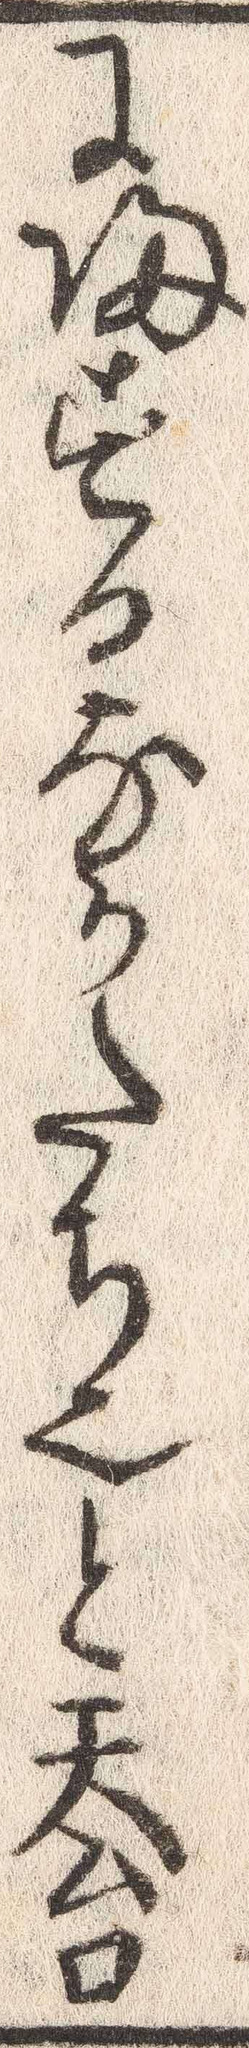に帰するなかたち也と天台
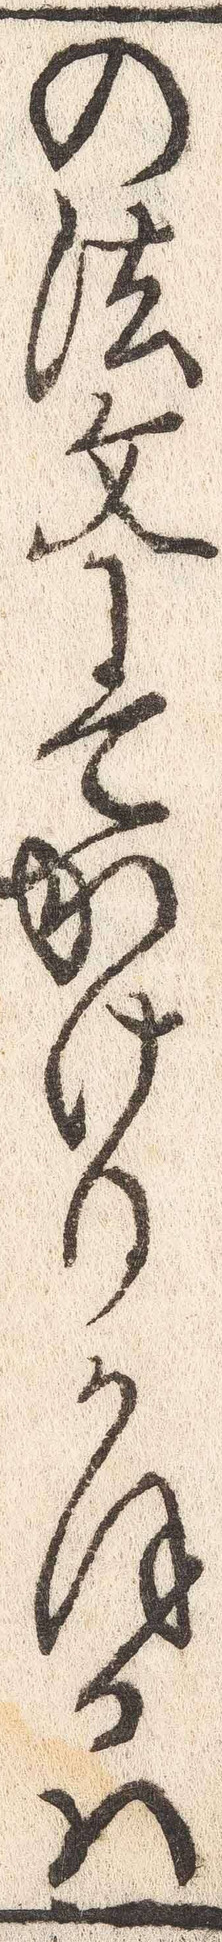の法文にてかけりかほるは
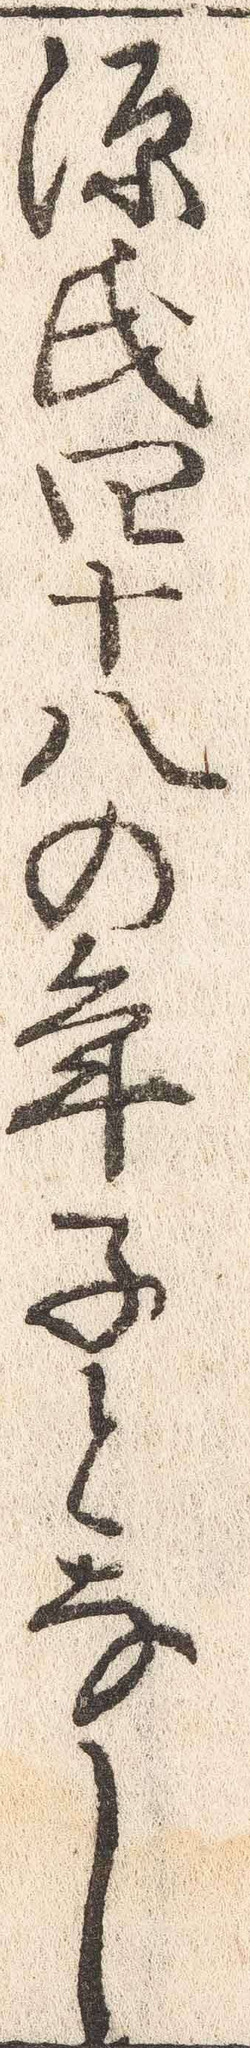源氏四十八の年子となし
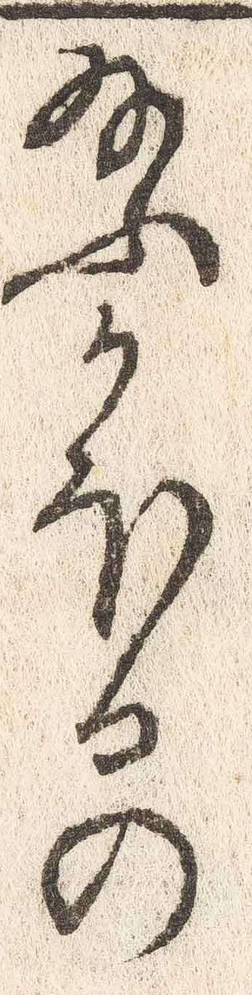給ふかほるの
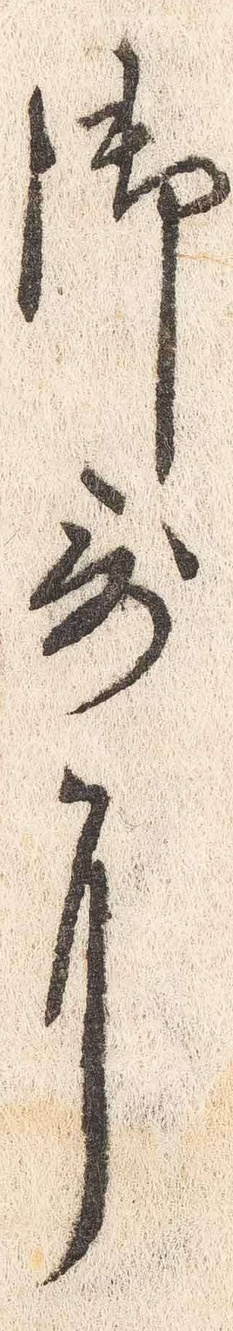御歌に

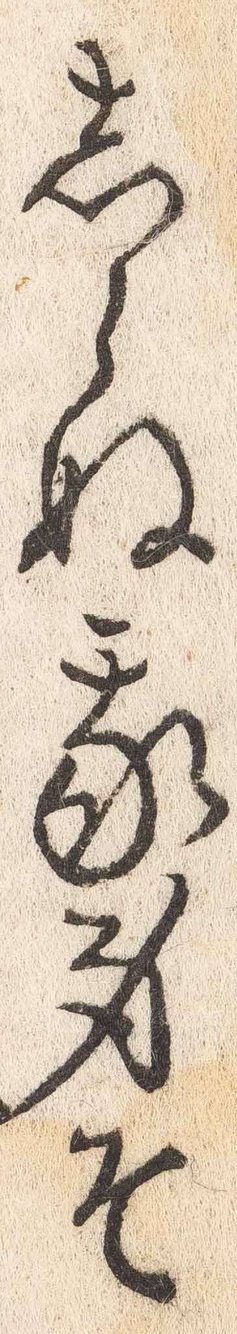しらぬ我身そ
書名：源氏物語
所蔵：東京学芸大学附属図書館 国文学研究資料館
